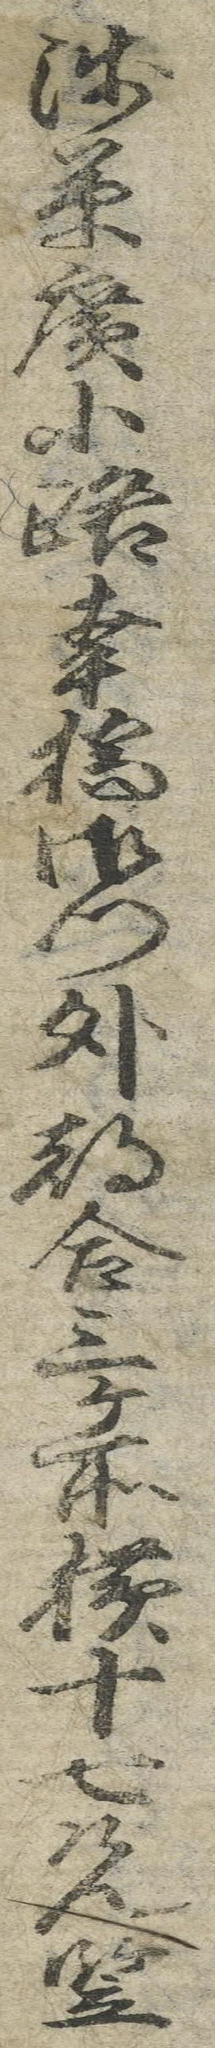浅草広小路幸橋御門他都合三ケ所横十七件竪
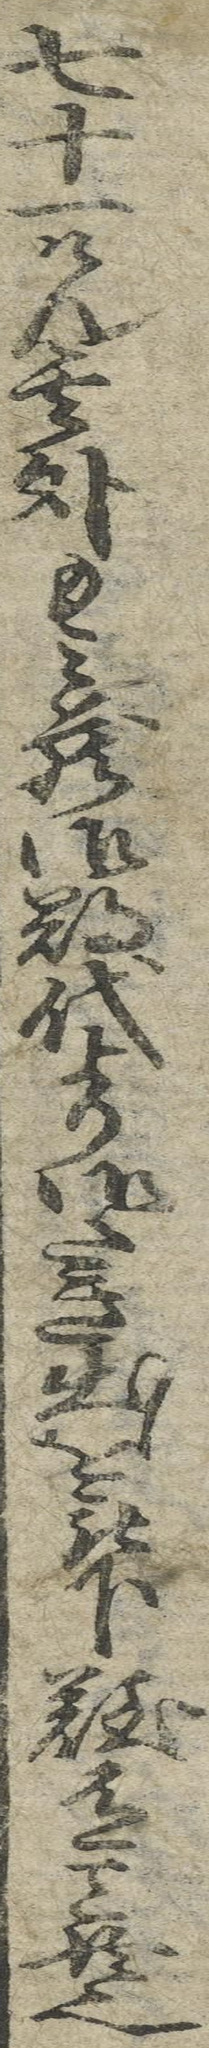七十一けん其外もみ蔵御郡代より御たき出を被下難有こと共也
